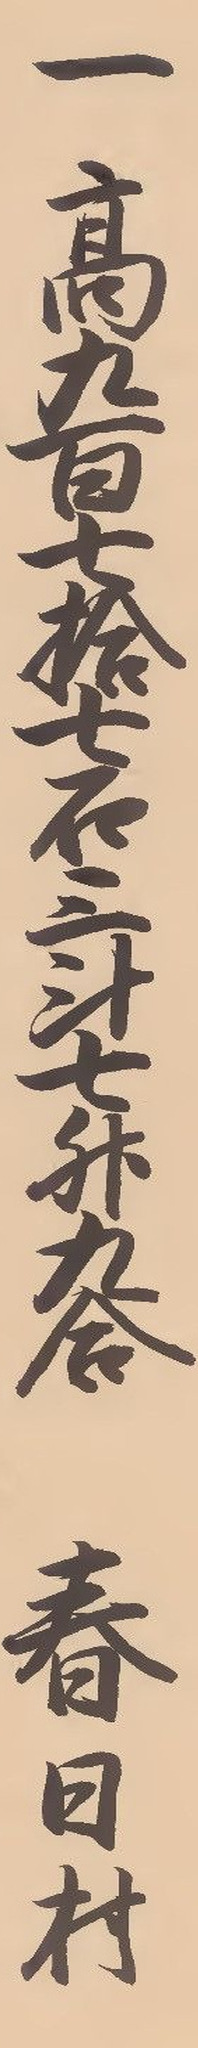一高九百七拾七石三斗七升九合春日村
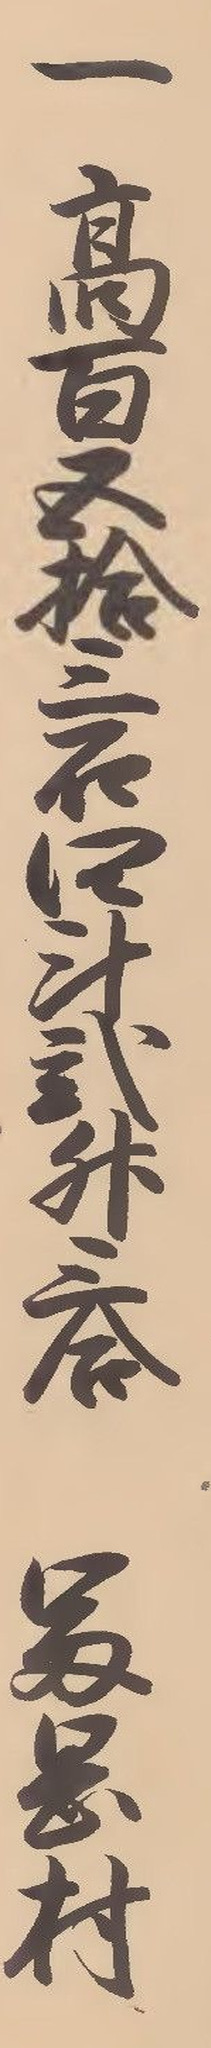一高百五拾三石四斗弐升三合富岡村
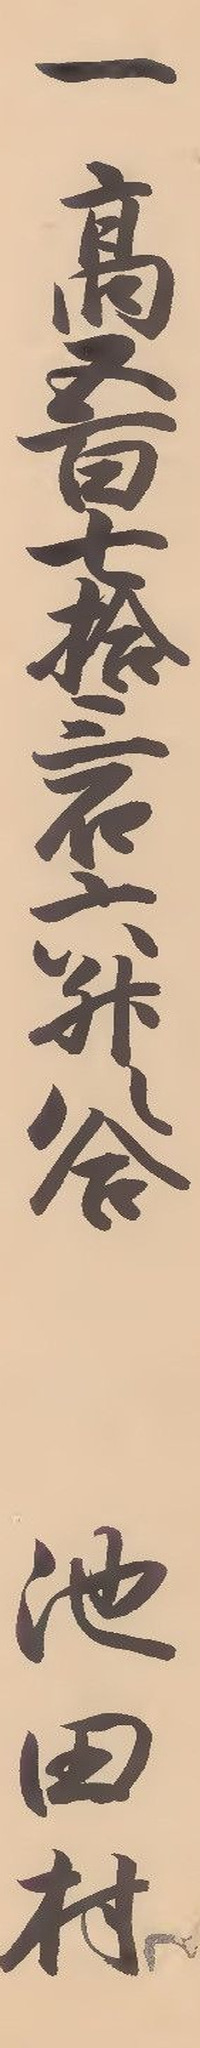一高五百七拾三石六升八合池田村
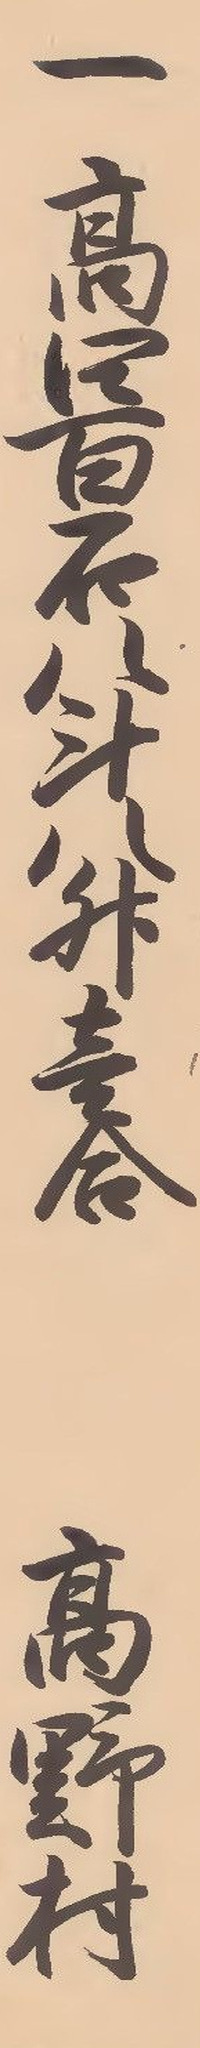一高四百石八斗八升壱合高野村
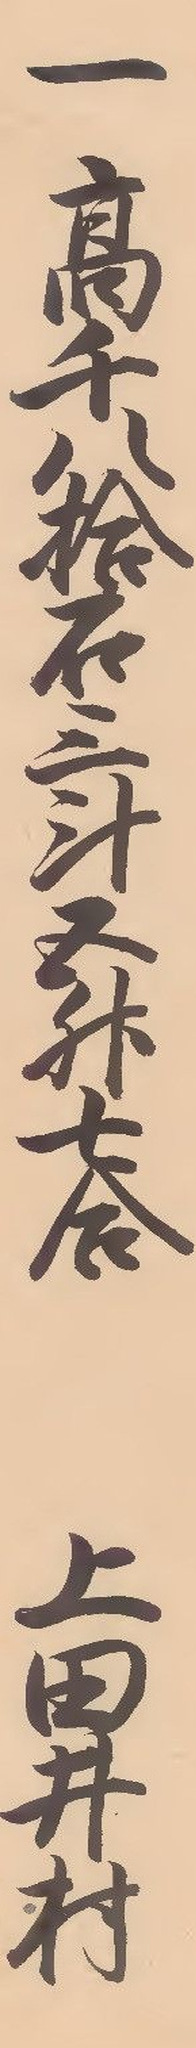一高千八拾石三斗五升七合上田井村

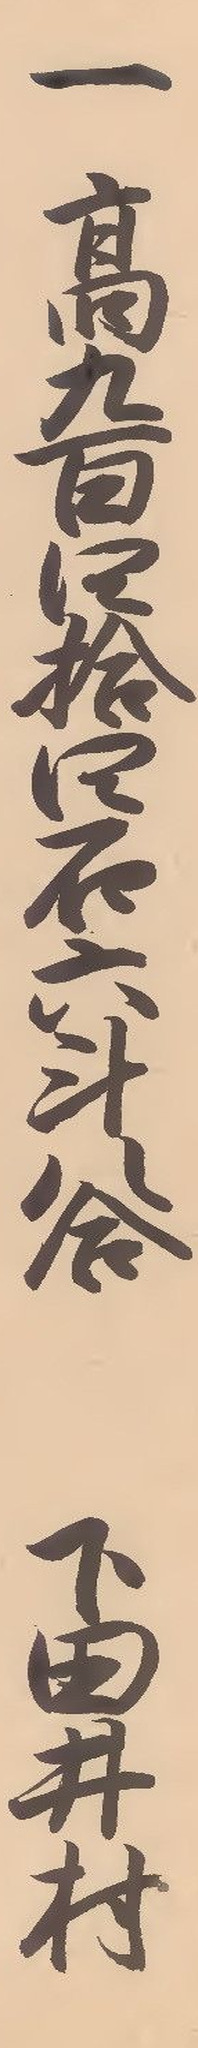一高九百四拾四石六斗八合下田井村
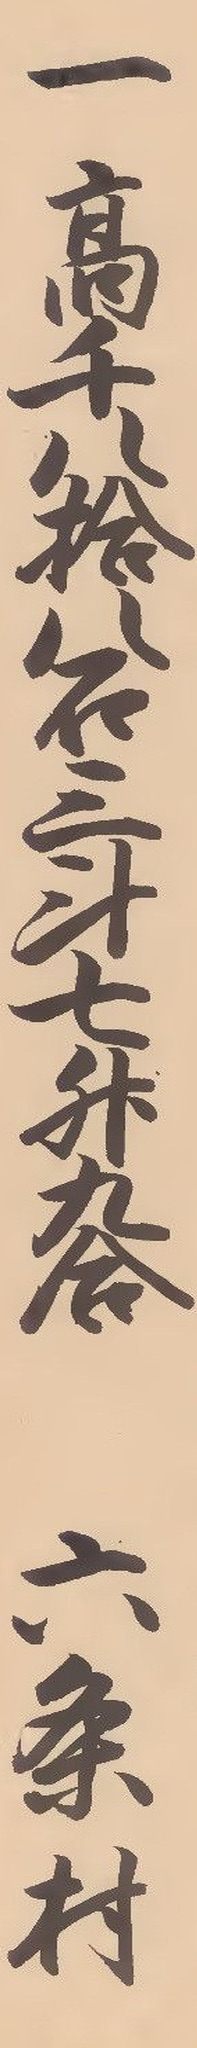一高千八拾八石三斗七升九合六条村
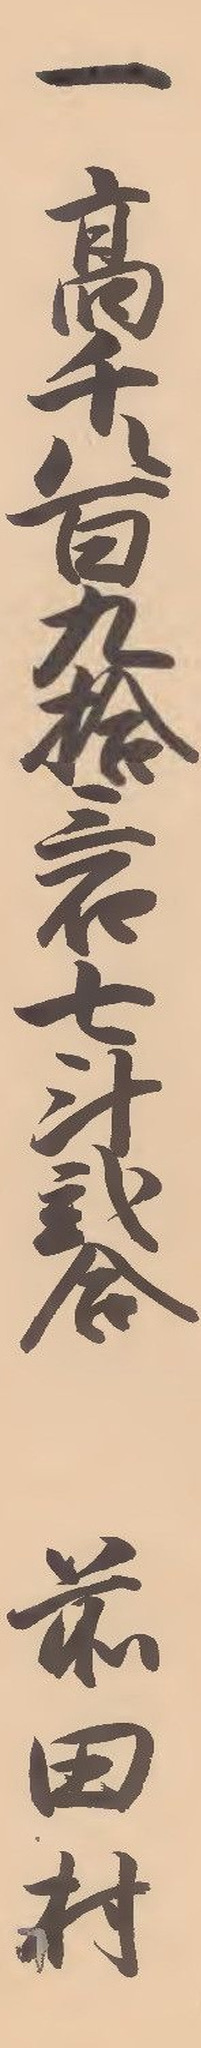一高千八百九拾三石七斗弐合前田村
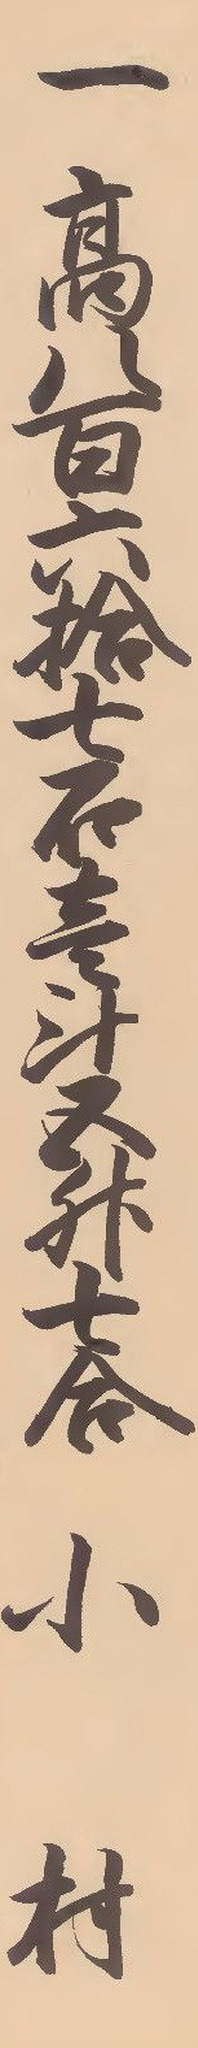一高八百六拾七石壱斗五升七合小村
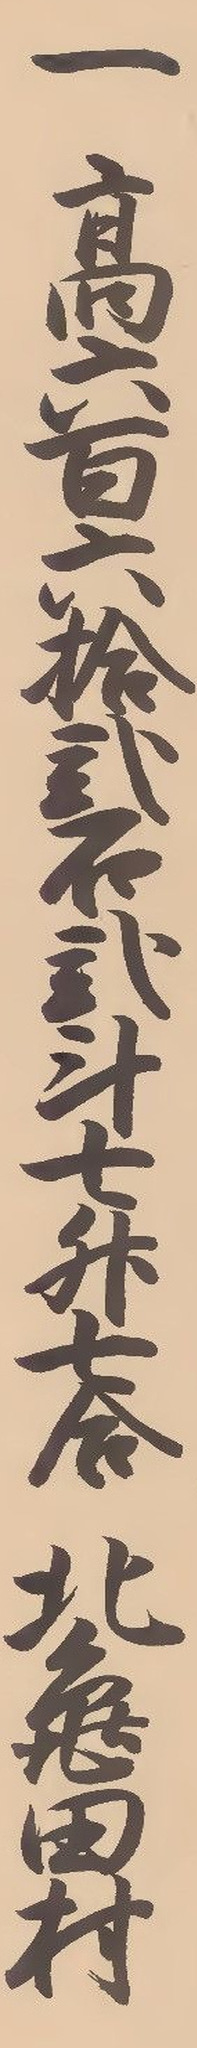一高六百六拾弐石弐斗七升七合北亀田村
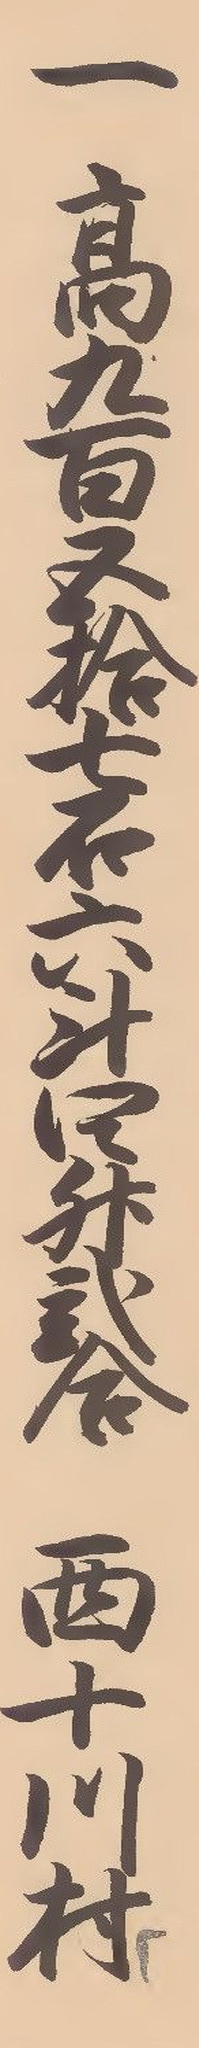一高九百五拾七石六斗四升弐合西十川村
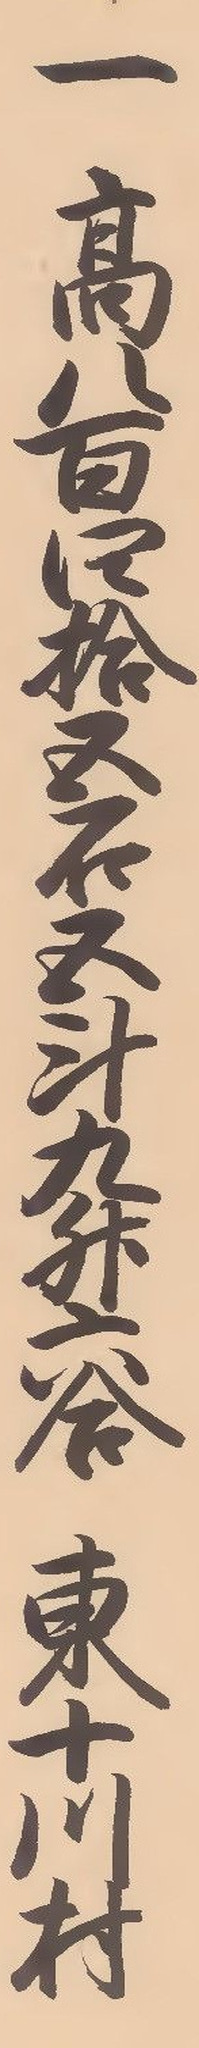一高八百四拾五石五斗九升六合東十川村
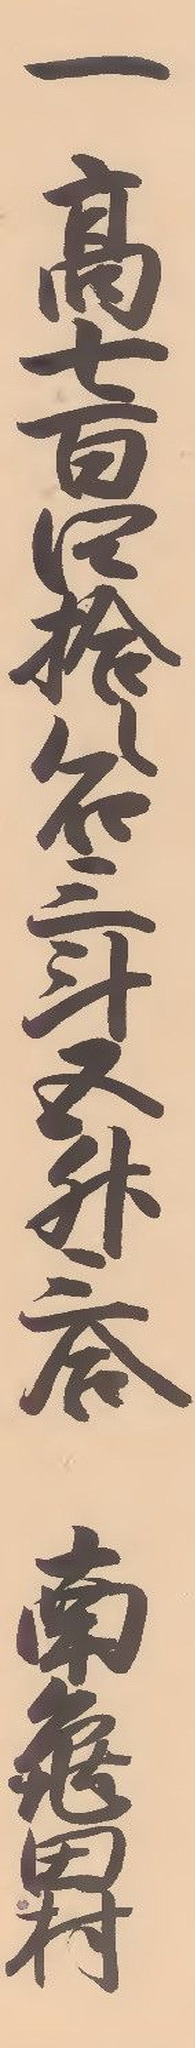一高七百四拾八石三斗五升三合南亀田村

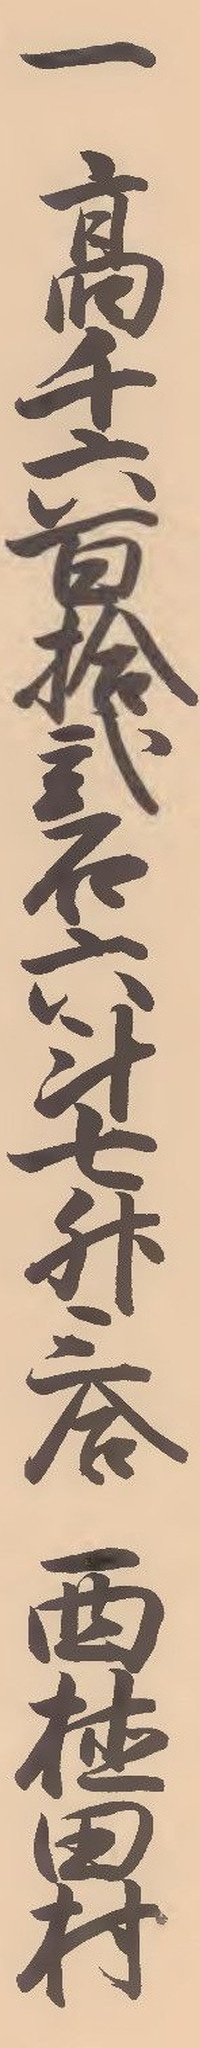一高千六百拾弐石六斗七升三合西植田村
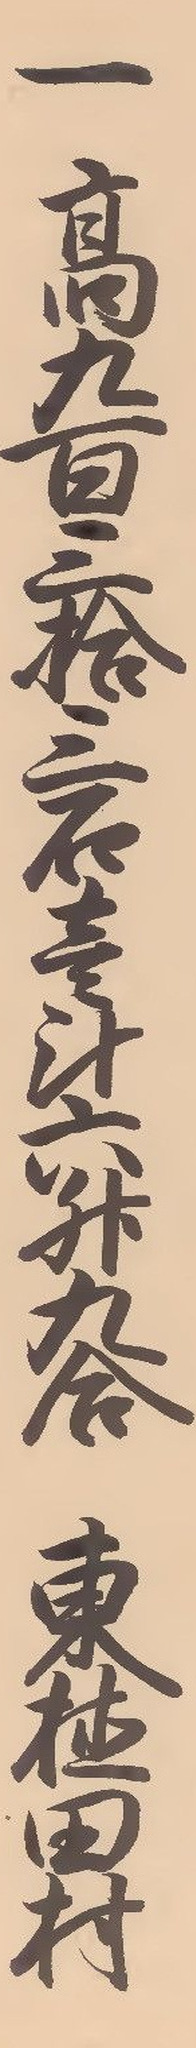一高九百三拾三石壱斗六升九合東植田村
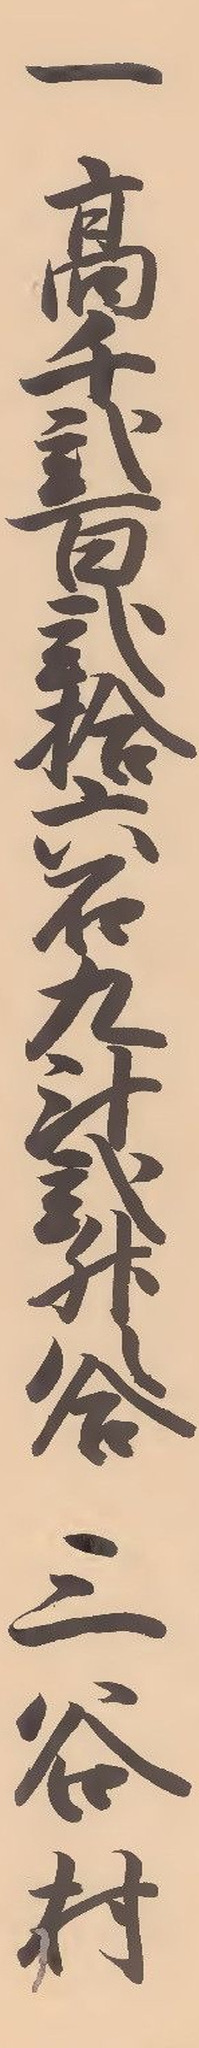一高千弐百弐拾六石九斗弐升八合三谷村
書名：讃岐国郷帳
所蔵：国立公文書館 National Archives of Japan
